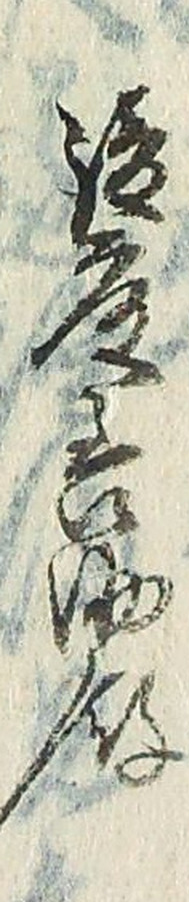後藤善助殿
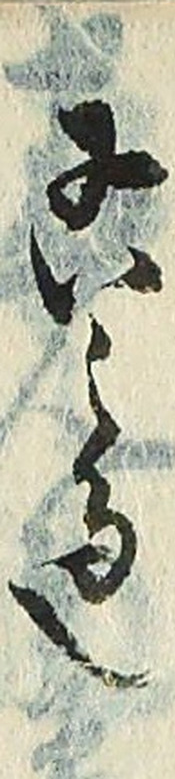右之通
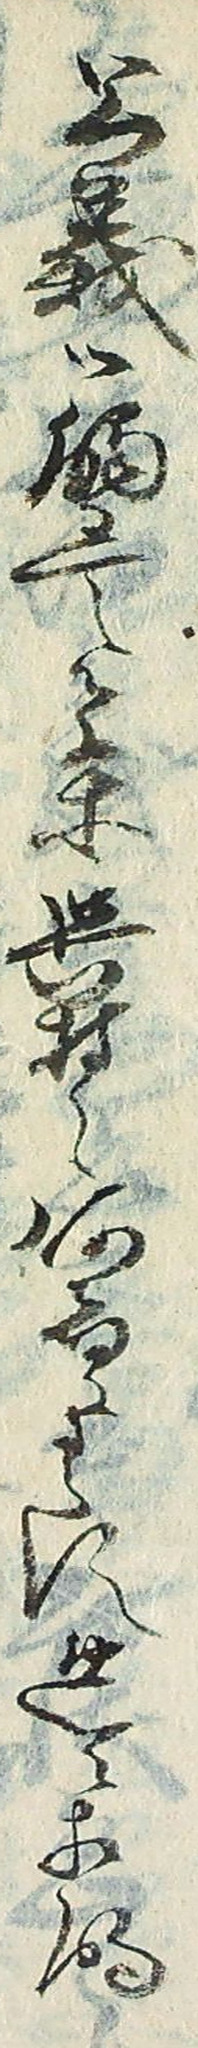公義御触有之候条与村々何者によらす逸々相触
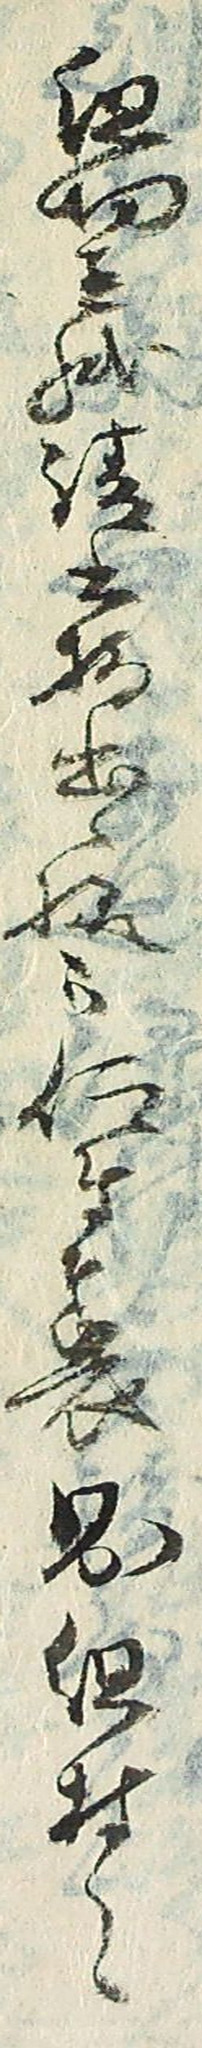組切壱紙請書指出候様被仰付奉畏則組村々
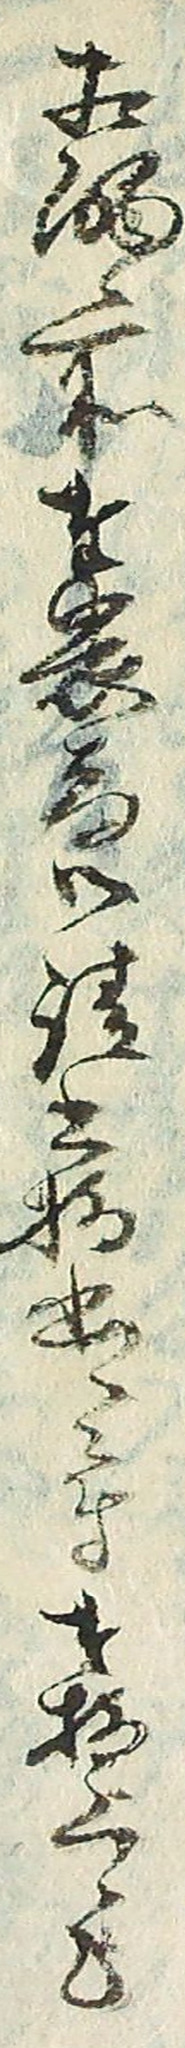相触候所奉畏旨御請書指出候に付奉指上候以上
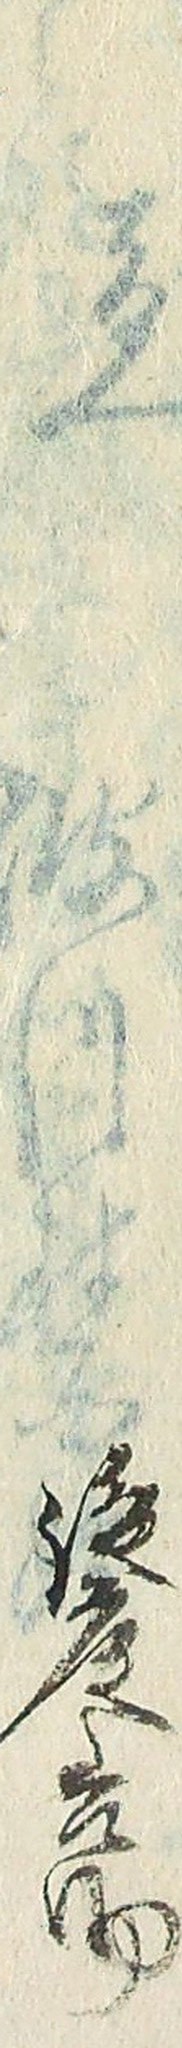後藤善助
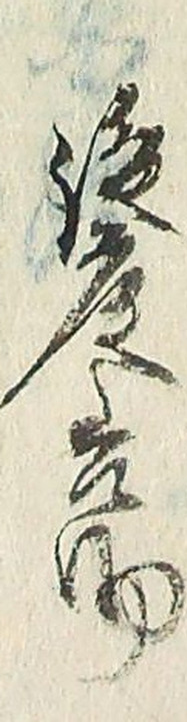後藤善助
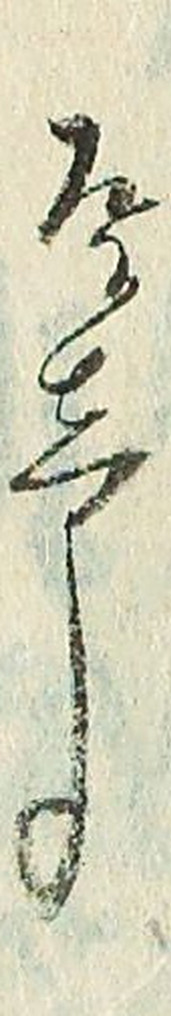辰十一月
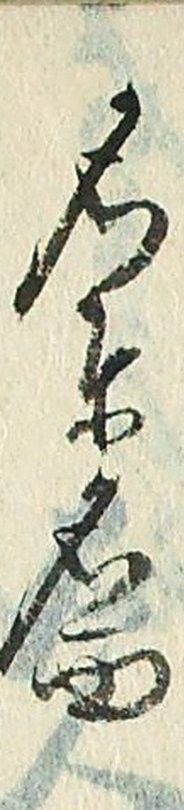名東名西
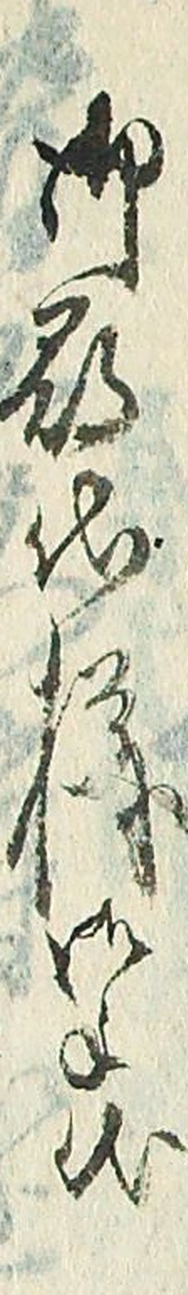御郡代様御手代
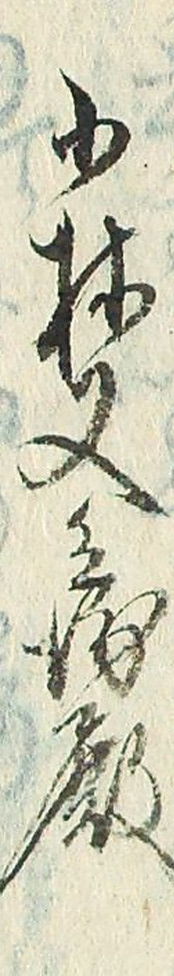小林又兵衛殿

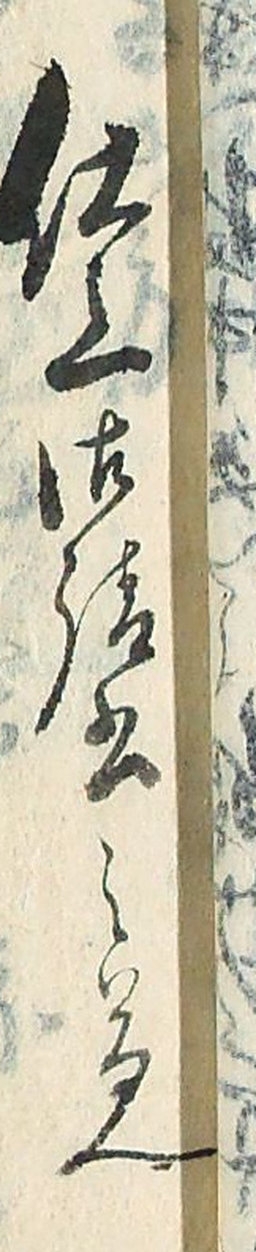仕上御請書之覚
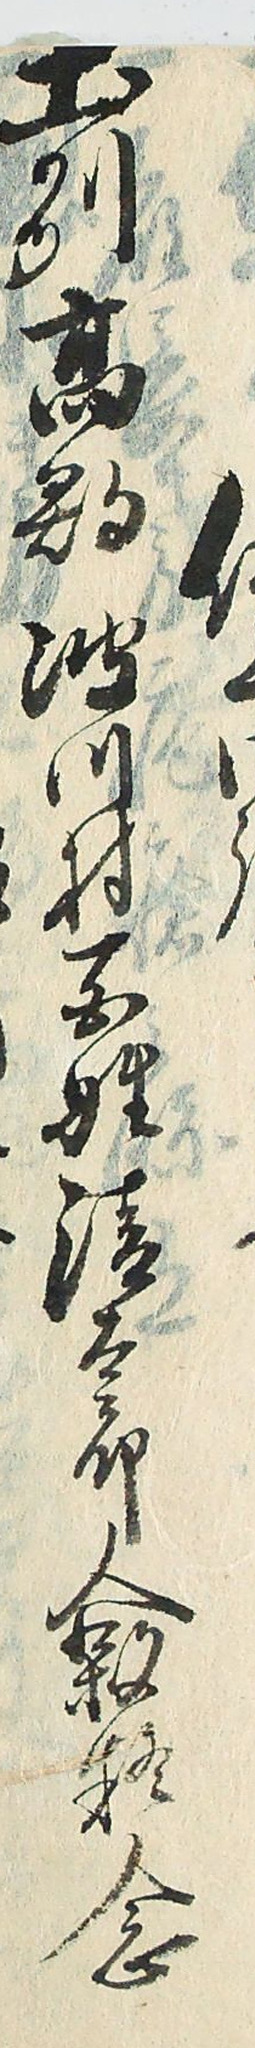土州高郡波川村百姓清太郎人殺疑念
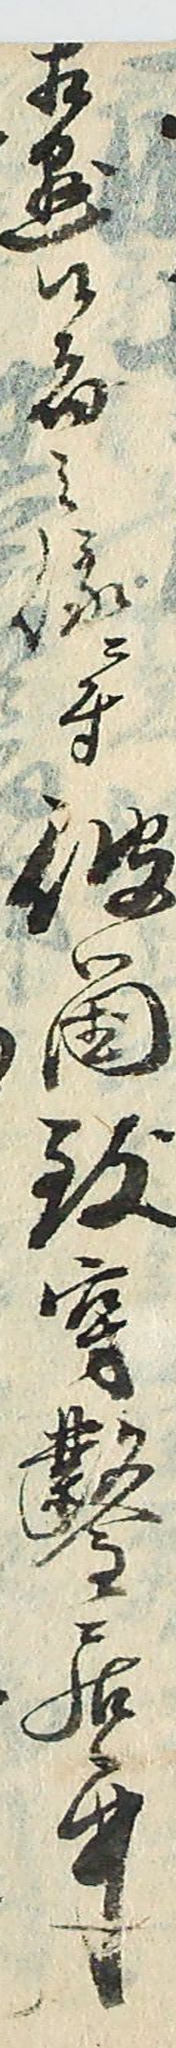相懸候者之儀に付彼御国致穿鑿居候中
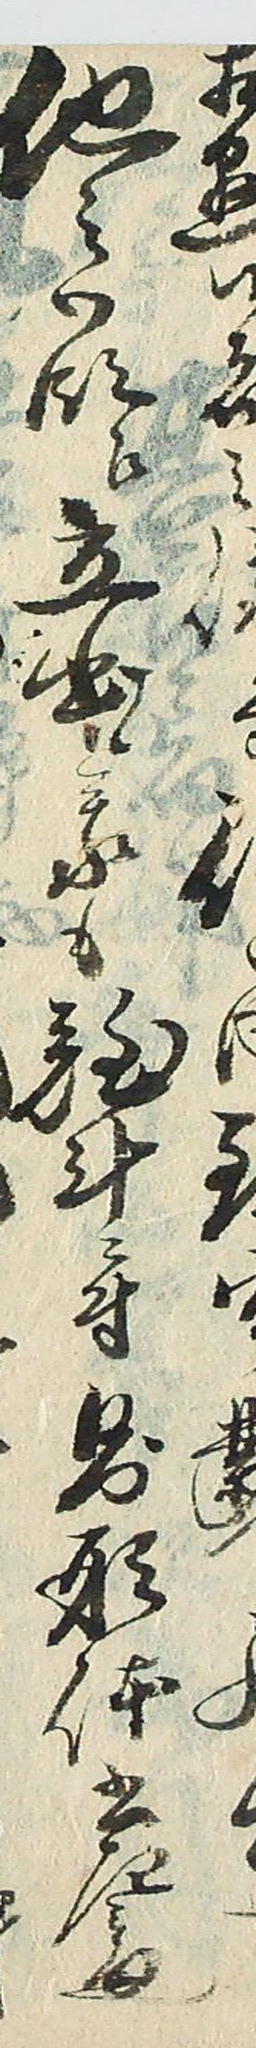他之御領江立出候義も難計に付則形体書左之通
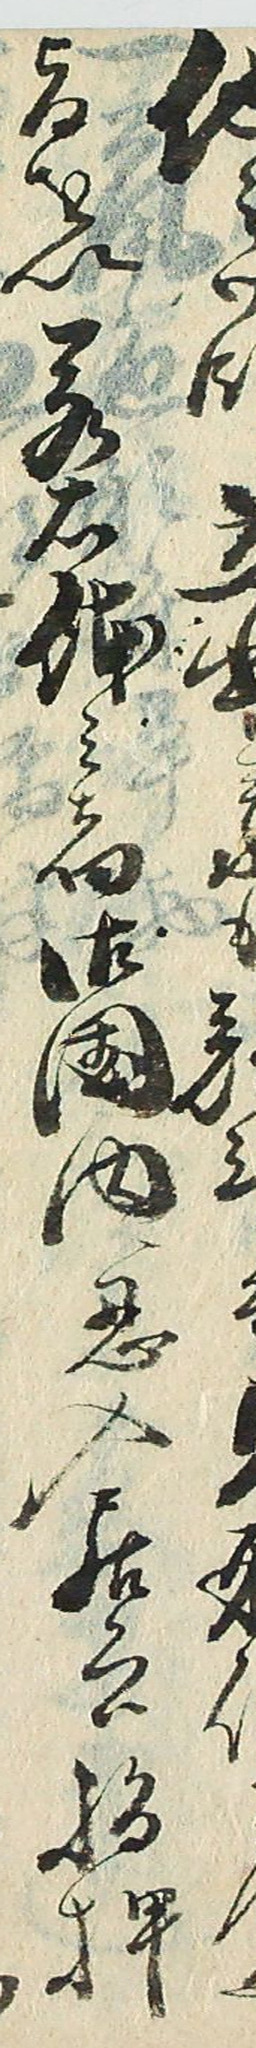旨を以若右体之者御国内へ忍入居候はゝ指押
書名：諸御用御□受書控
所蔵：鳴門教育大学 Naruto University of Education
